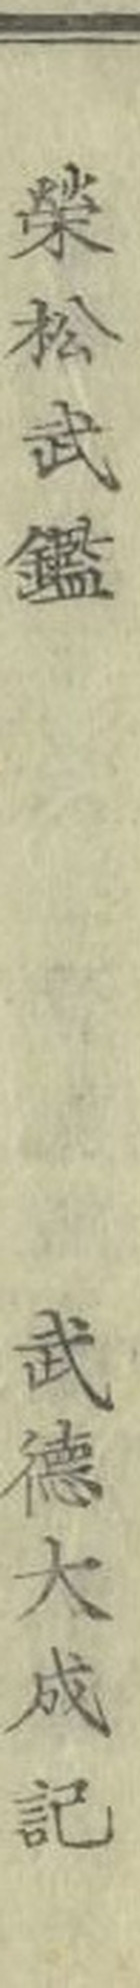榮松武鑑武德大成記
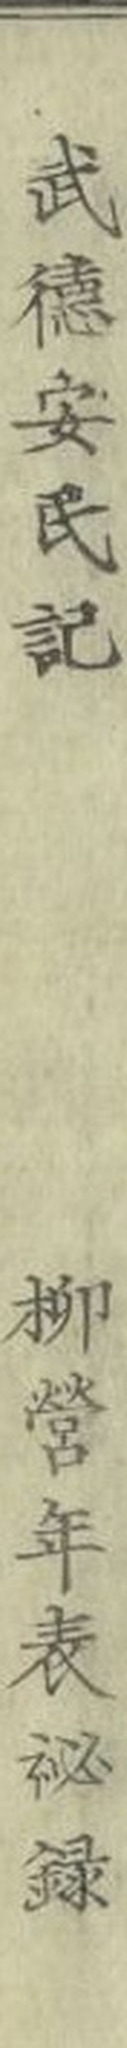武德安氏記柳營年表秘録
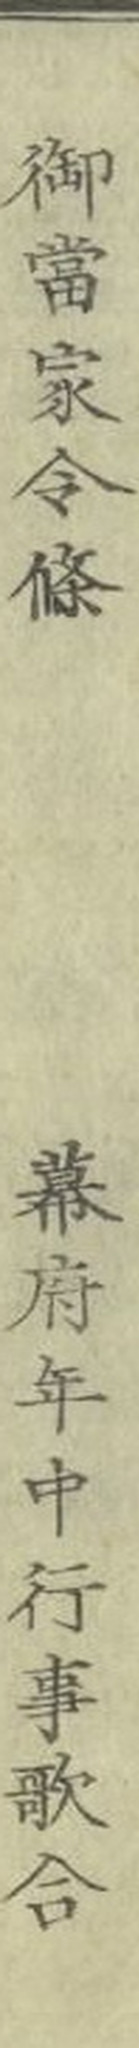御當家令條幕府年中行事歌合
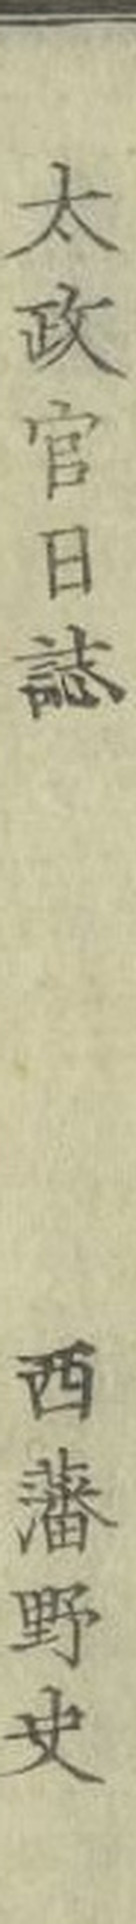太政官日誌西藩野史
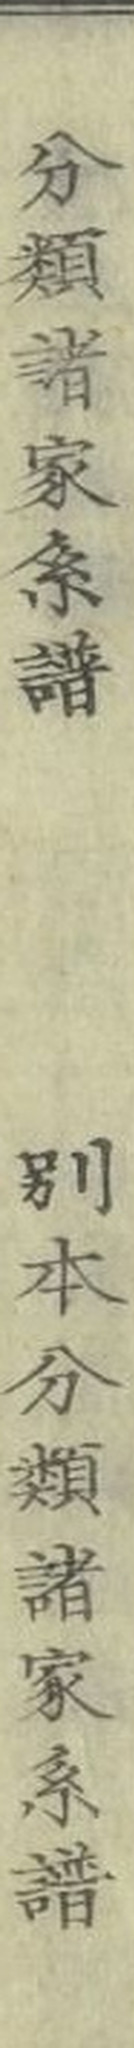分類諸家系譜別本分類諸家系譜
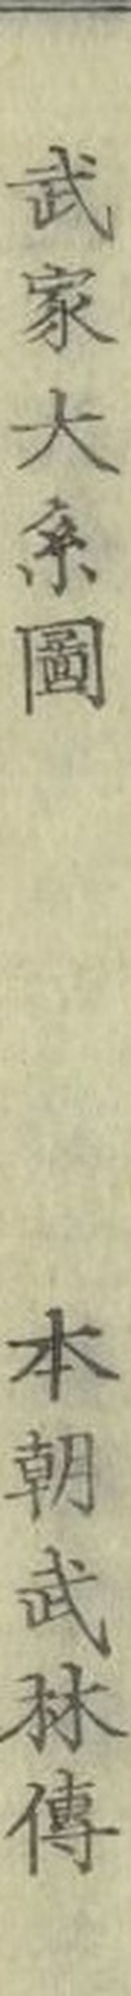武家大系圖本朝武林傳
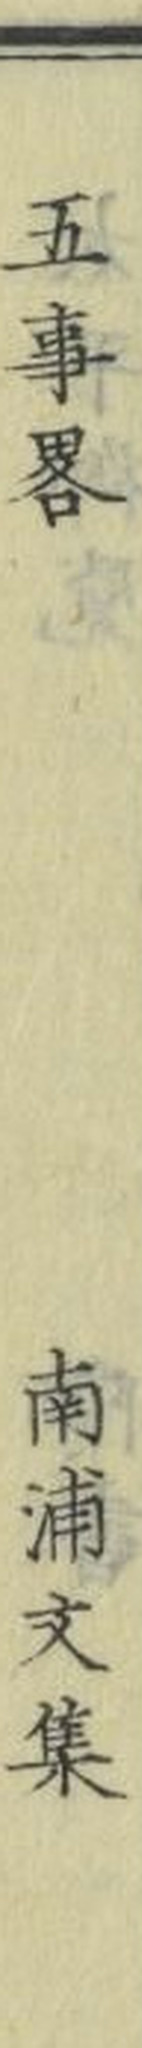五事畧南浦文集
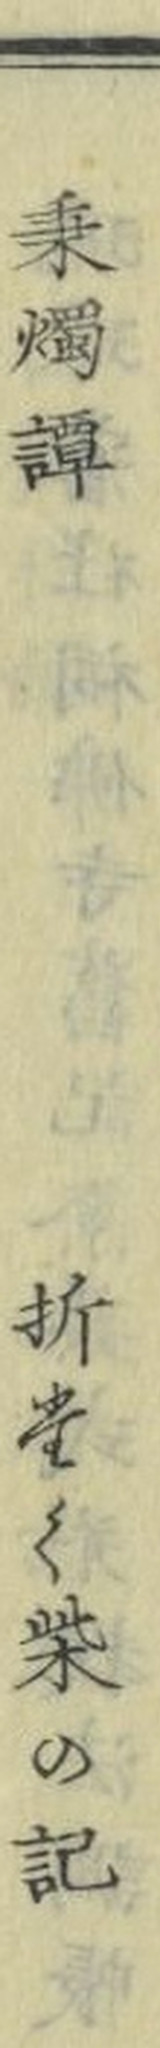乗燭譚折たく柴の記
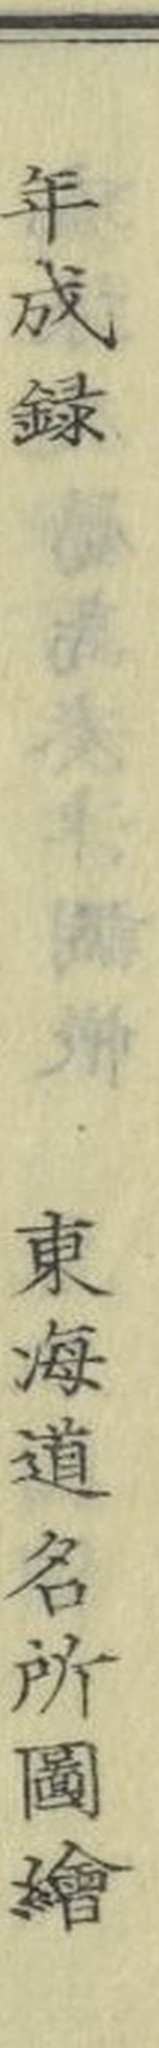年成録東海道名所國繪
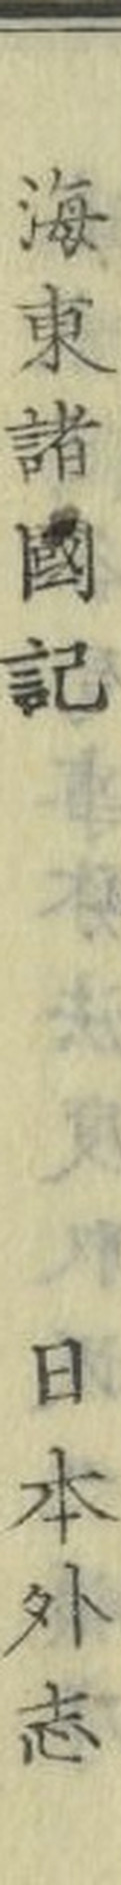海東諸國記日本外志
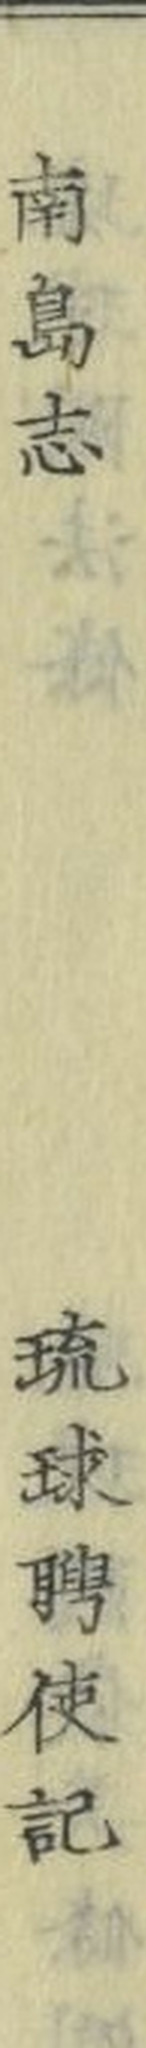南島志琉球聘使記
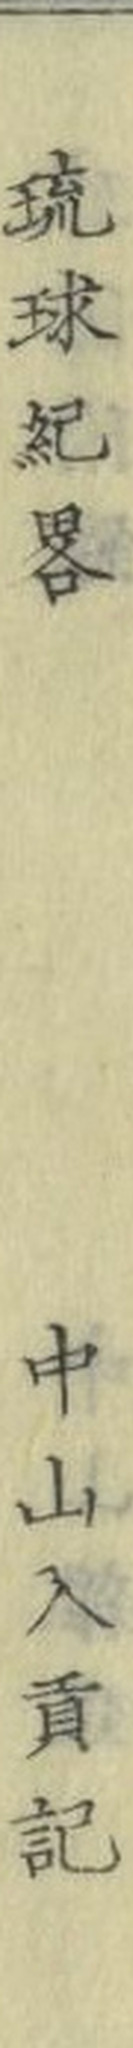琉球紀畧中山入貢記
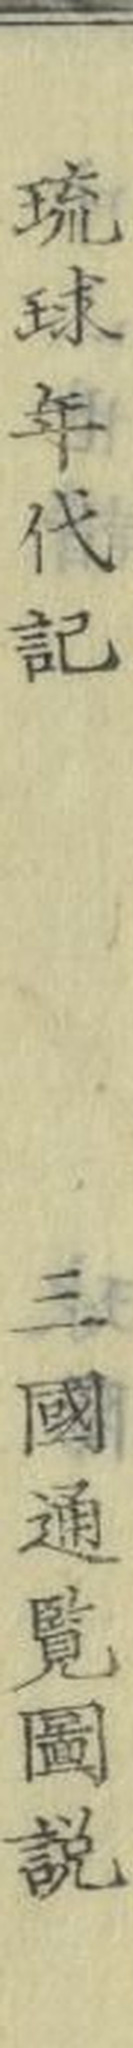琉球年代記三國通覽圖說

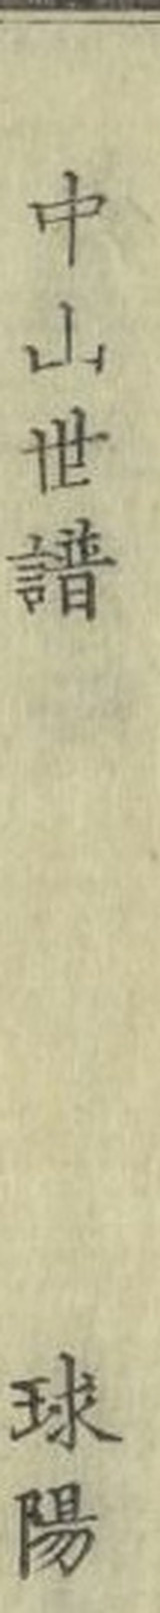中山世譜球陽
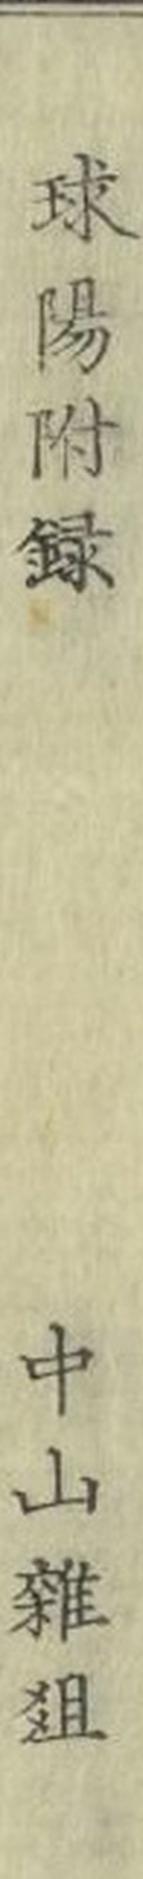球陽附録中山雜爼
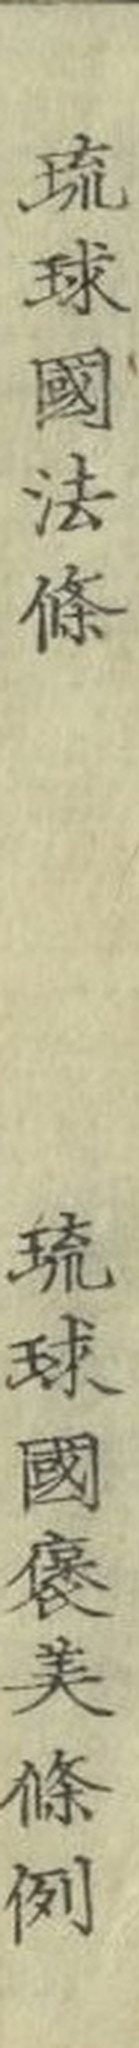琉球國法條琉球國褒美條例
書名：琉球藩史 一之巻
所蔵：University of the Ryukyus Library
